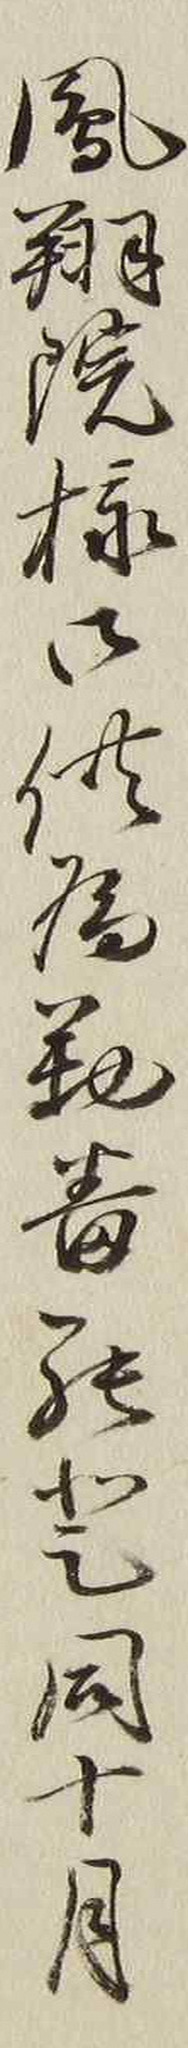鳳翔院様御供為勤番罷登同十月
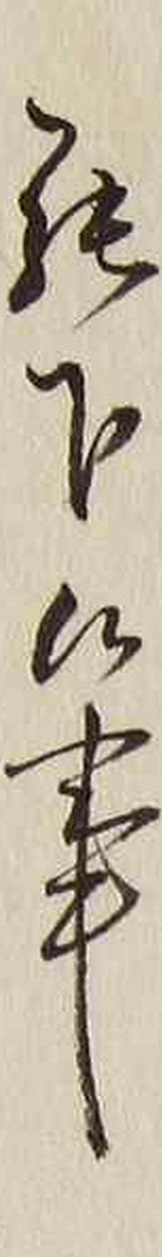罷下候事
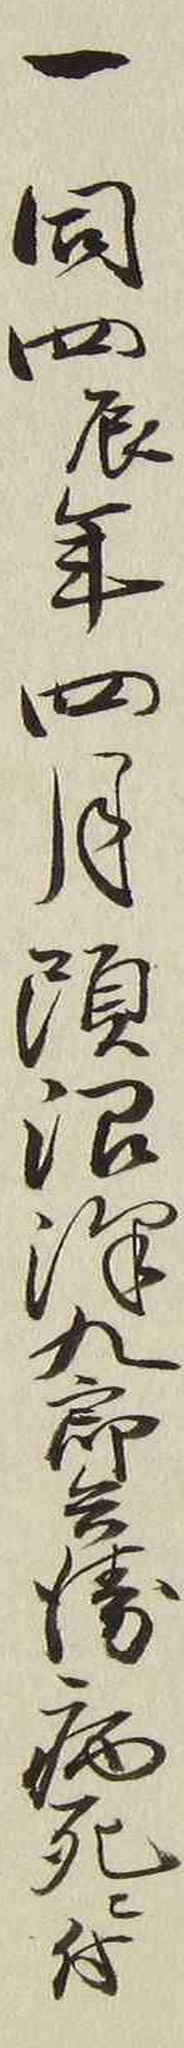一同四辰年四月頭沼沢九郎兵衛病死ニ付
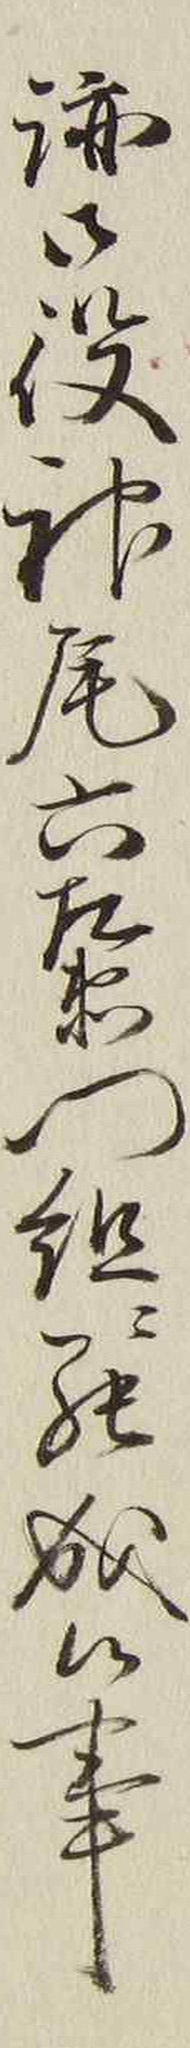跡御役神尾六左衛門組ニ罷成候事
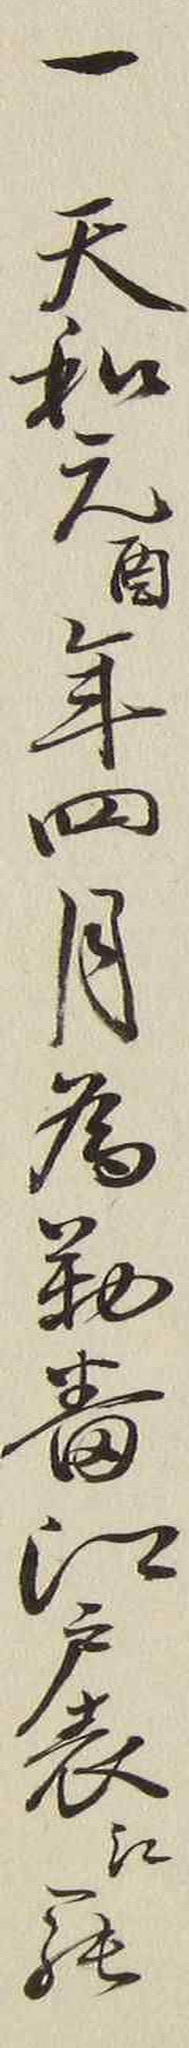一天和元酉年四月為勤番江戸表ぇ罷

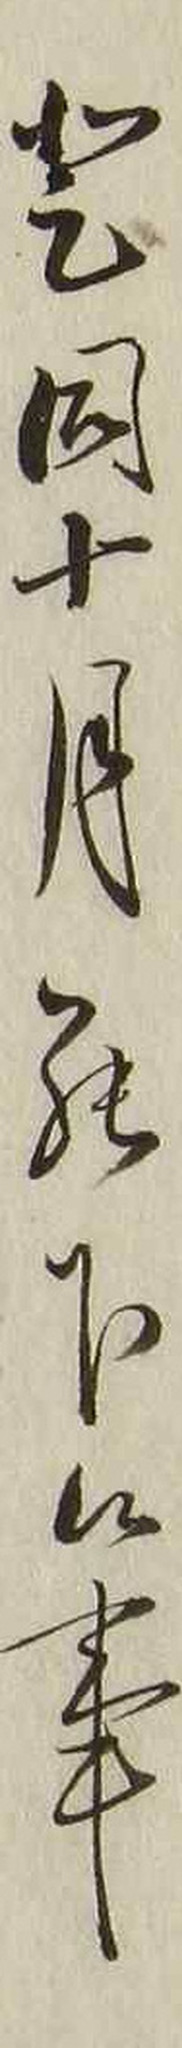登同十月罷下候事
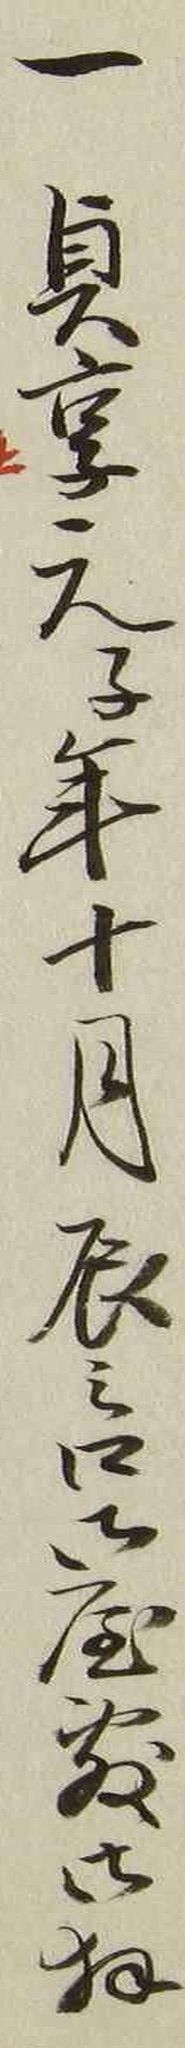一貞享元子年十月立野辰之口御屋敷御拝
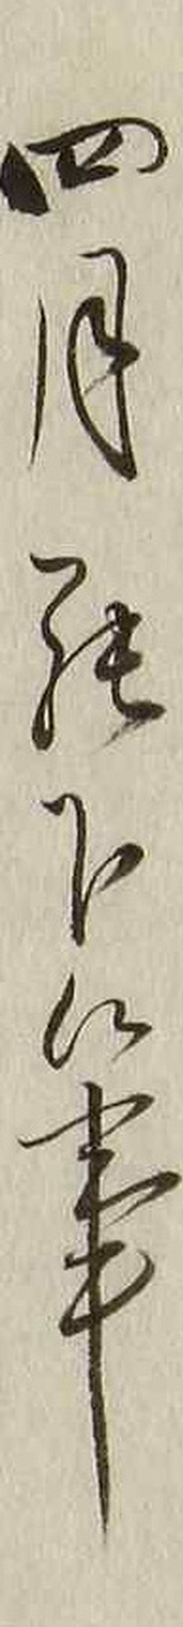四月罷下候事
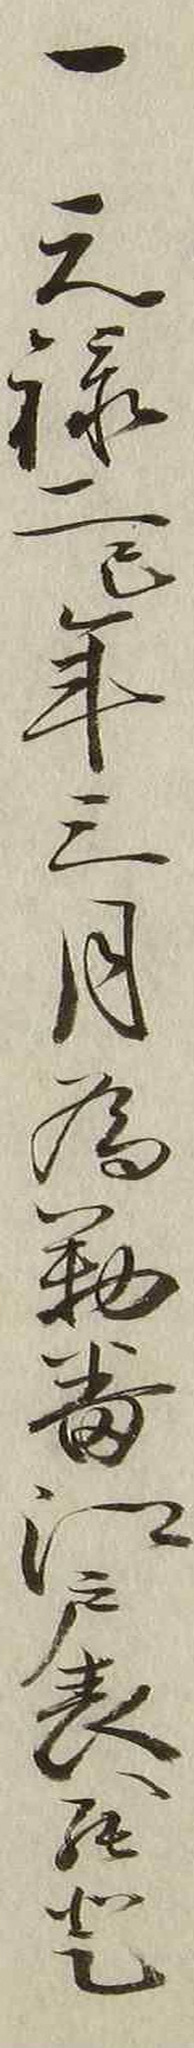一元禄二巳年三月為勤番江戸表ㇸ罷登
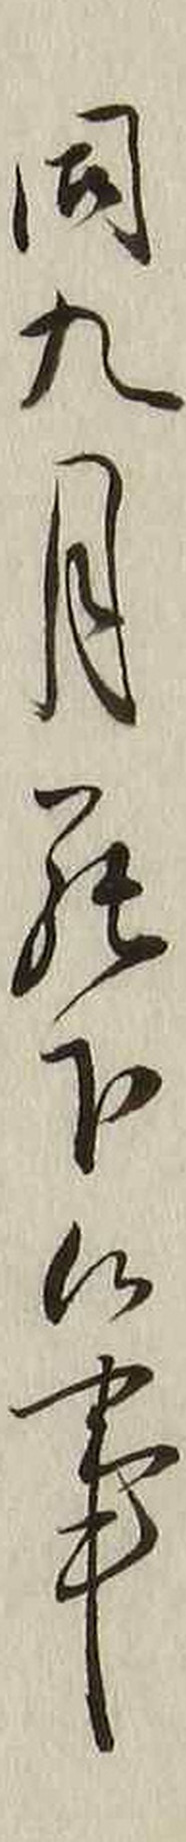同九月罷下候事
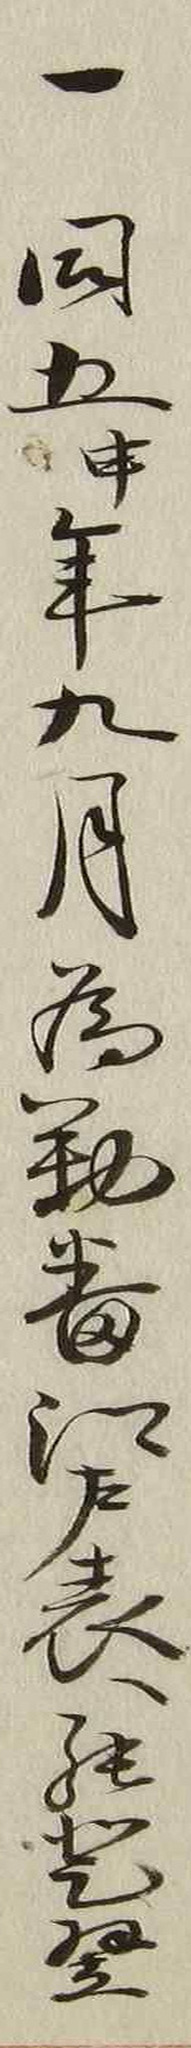一同五申年九月為勤番江戸表ㇸ罷登翌
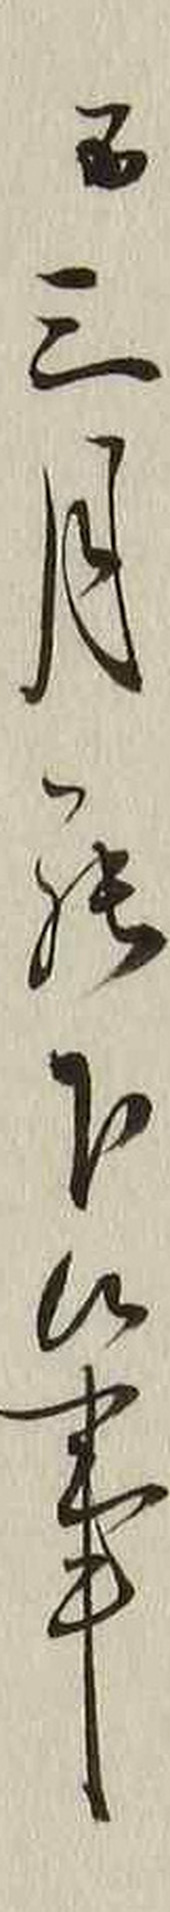酉三月罷下候事
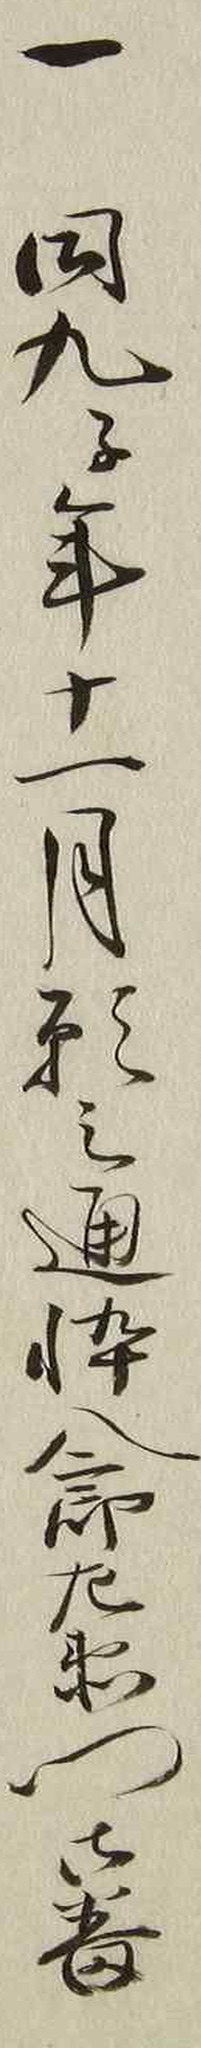一同九子年十一月願之通忰八郎左衛門御番
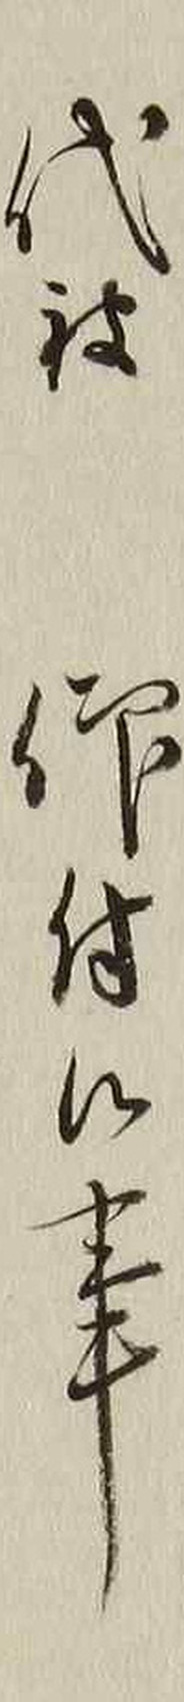代被仰付候事
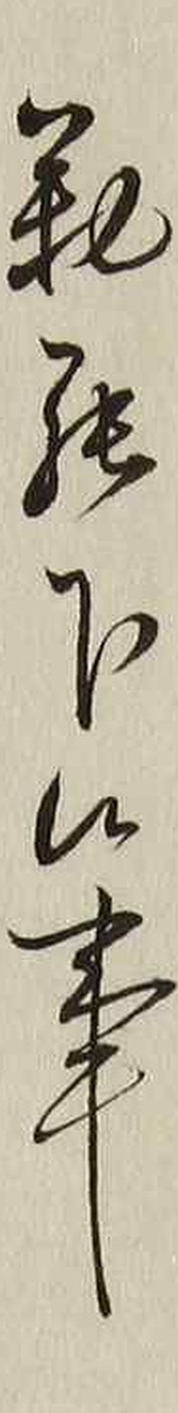勤罷下候事
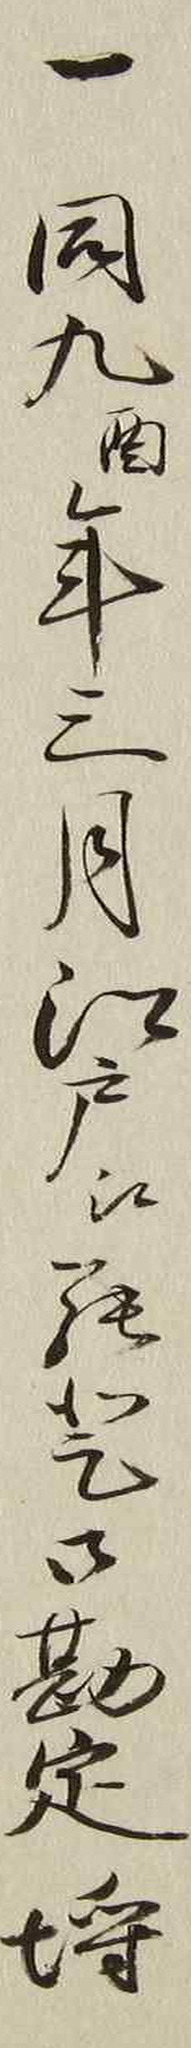一同九酉年三月江戸ぇ罷登御勘定埒
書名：諸士系譜　巻之163　な之部5
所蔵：会津若松市立会津図書館
